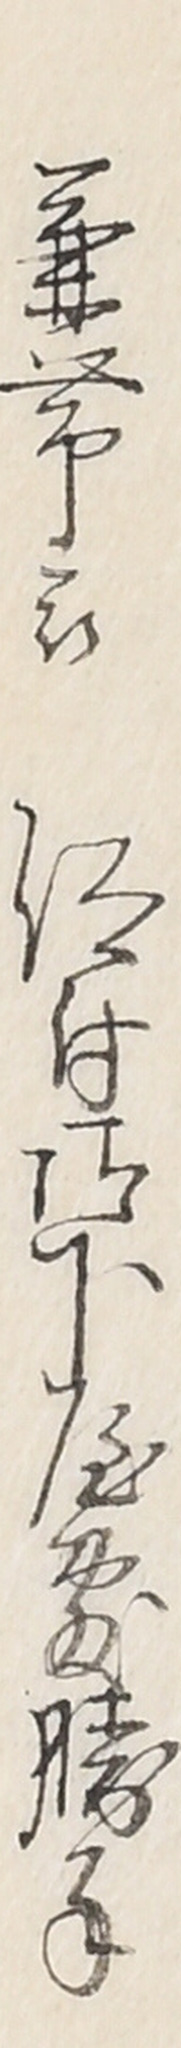兼帯被仰付御下屋敷勝手
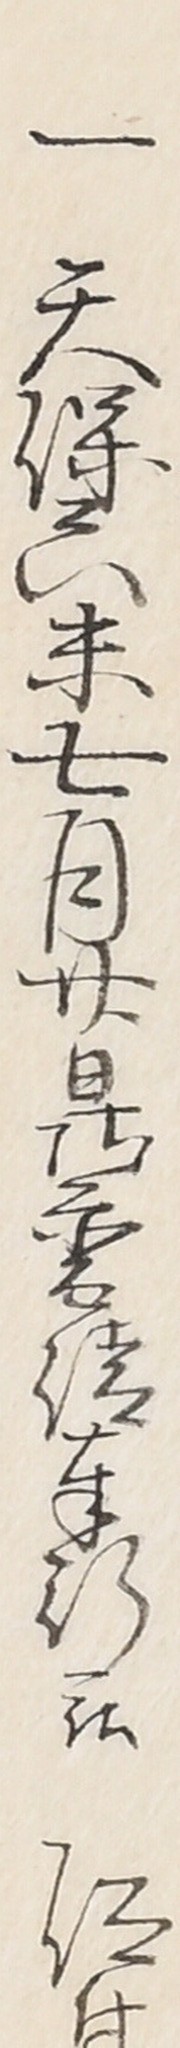一天保六未七月廿日普請奉行被仰付
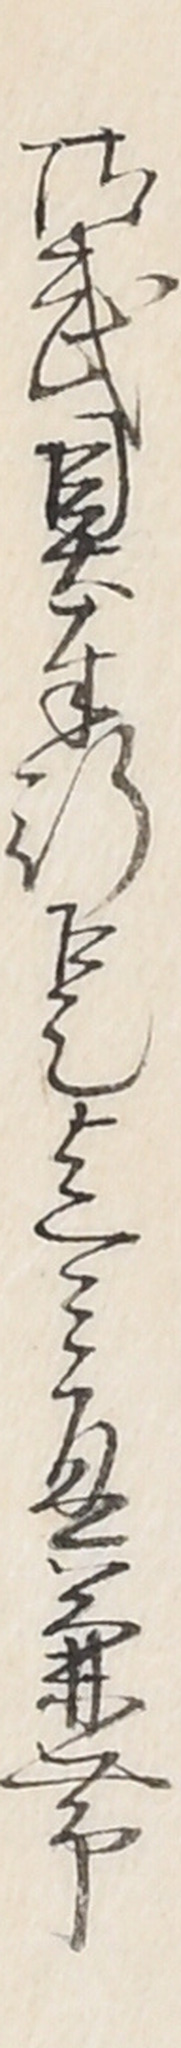御武具奉行是迄之通兼帯
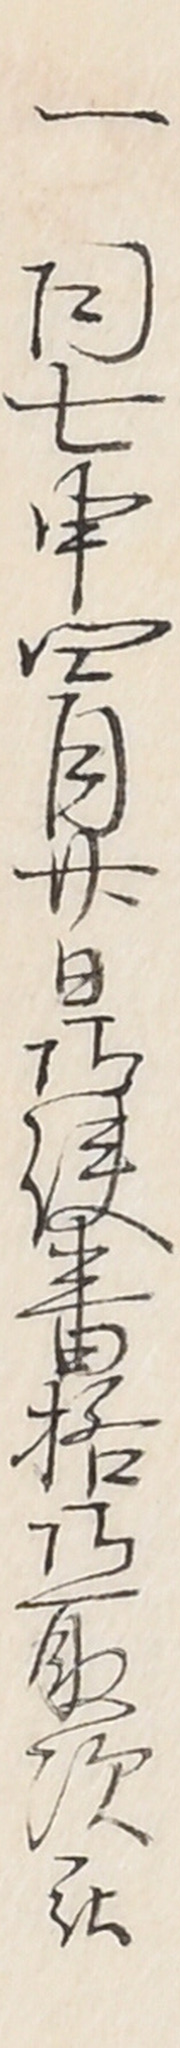一同七申四月廿日御使番格御取次被
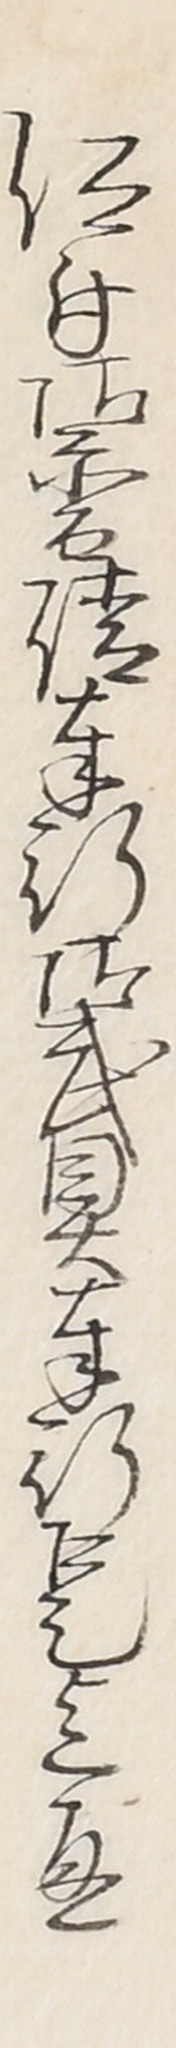仰付御普請奉行御武具奉行是迄通
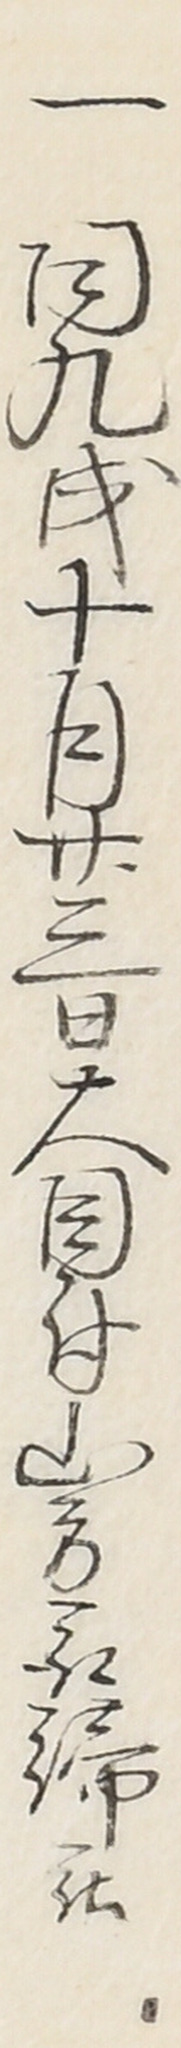一同九戌十月廿三日大目付山方取締被
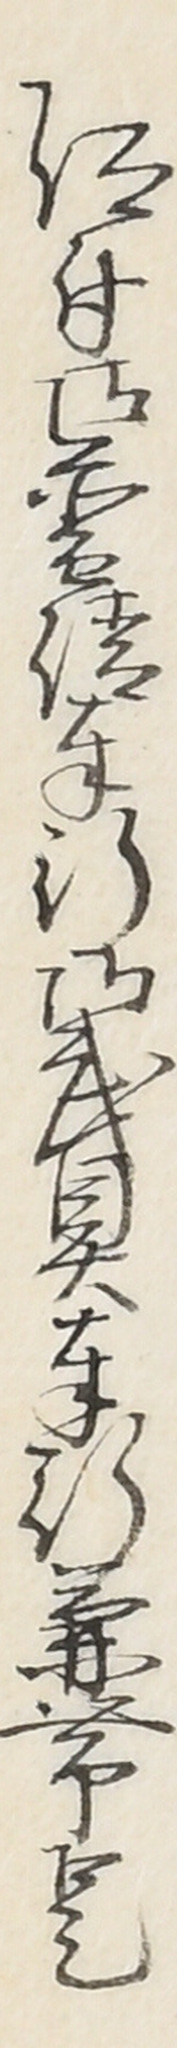仰付御普請奉行御武具奉行兼帯是
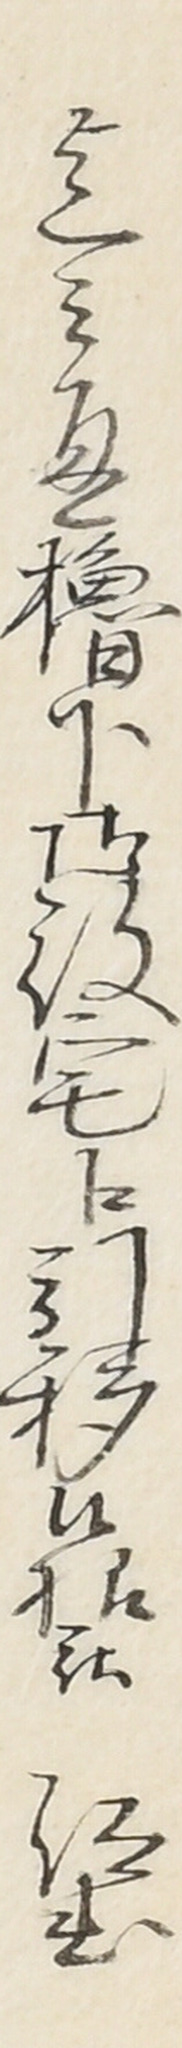迄之通櫓下御役宅江引移候様被仰出
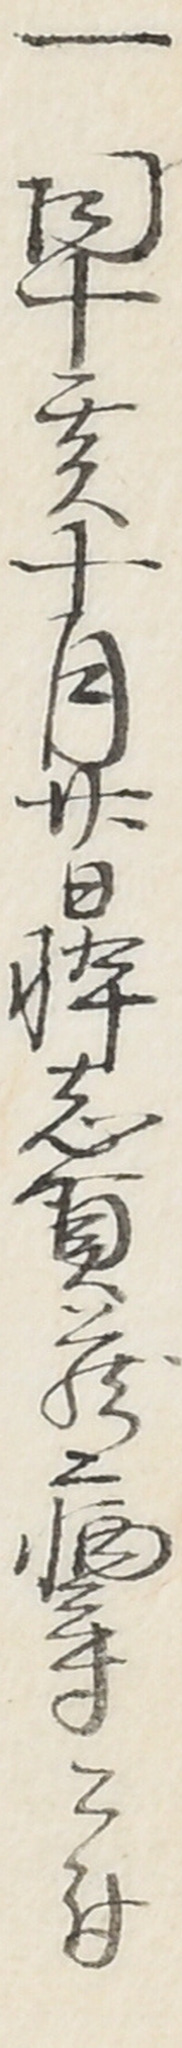一同十亥十月廿日忰志賀蔵病気ニ付
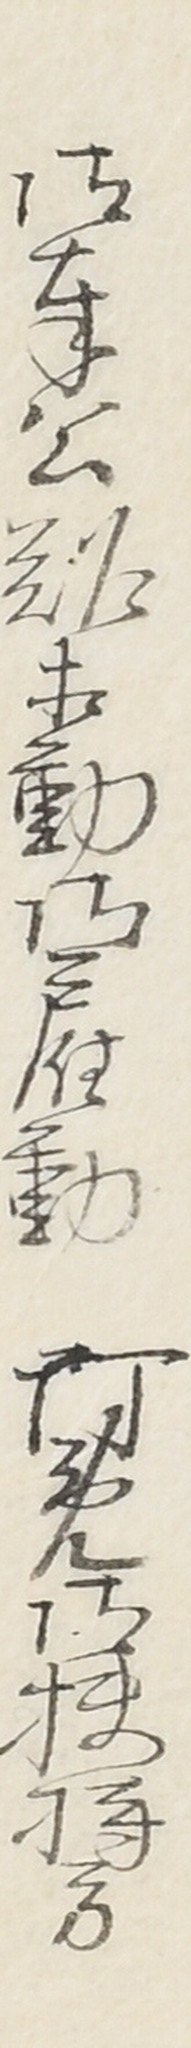御奉公難相勤御雇勤御免御扶持方
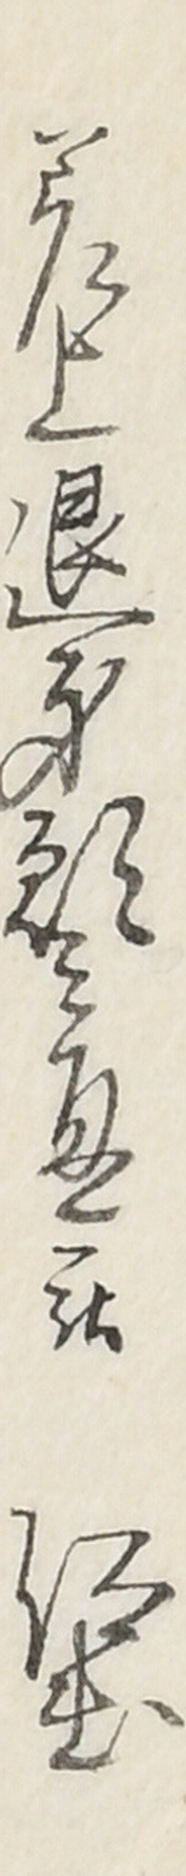差上退身願之通被仰出
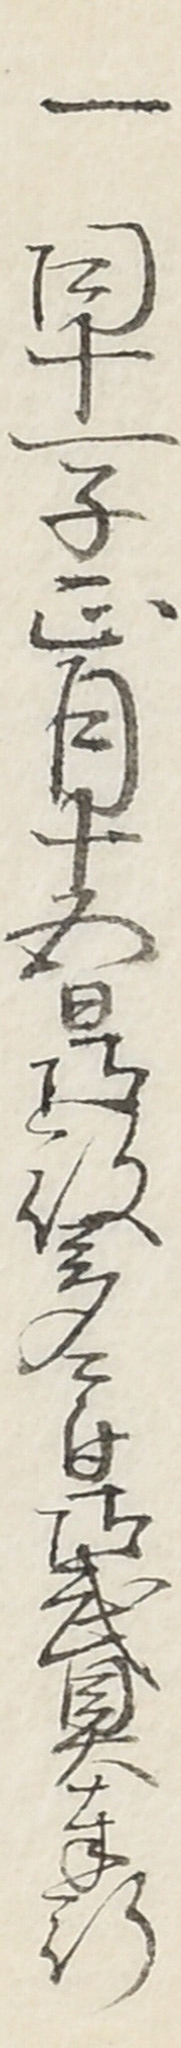一同十一子正月十五日御役多ニ付御武具奉行
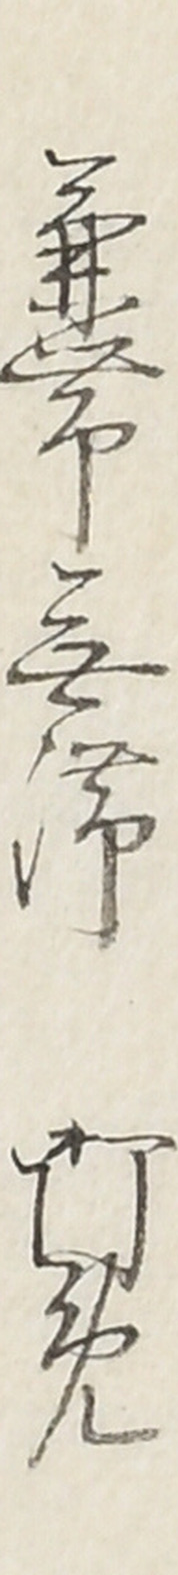兼帯無滞御免
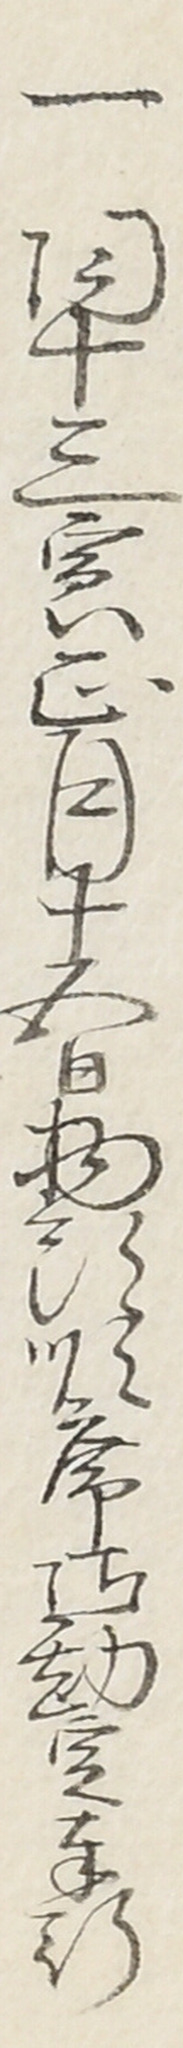一同十三寅正月十五日物頭順席御勘定奉行
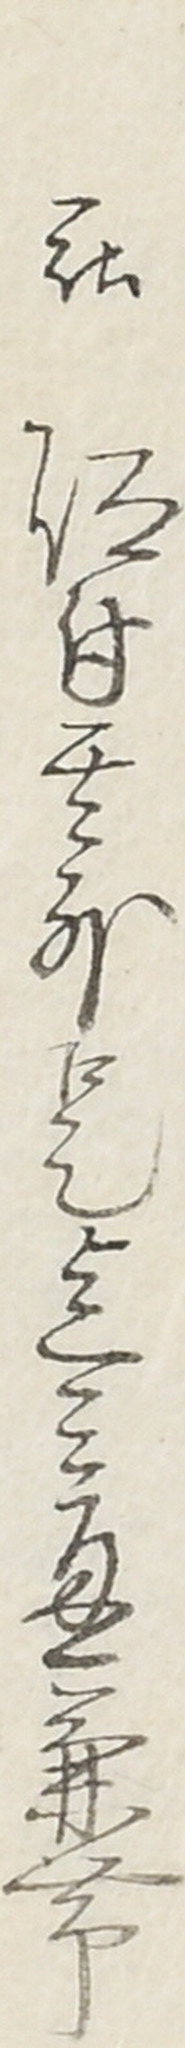被仰付其外是迄之通兼帯
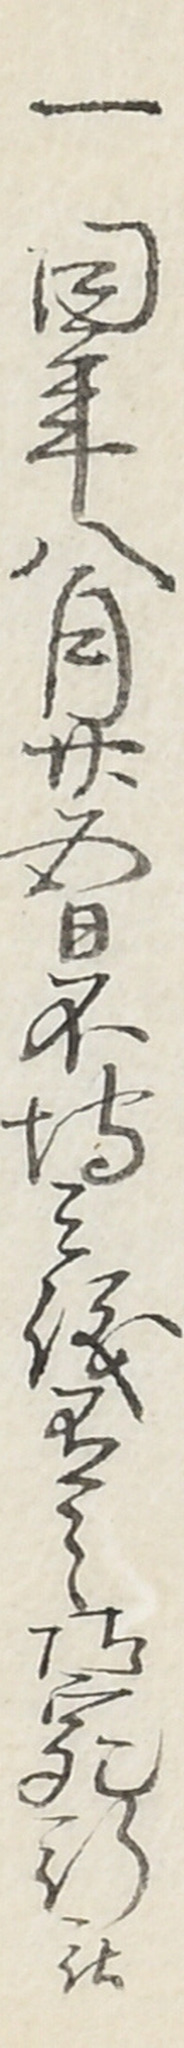一同年八月廿五日不埒之儀有之御宛行被
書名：給人諸士勤仕録（七）
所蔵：伊那市立高遠町図書館・合同会社AMANE
